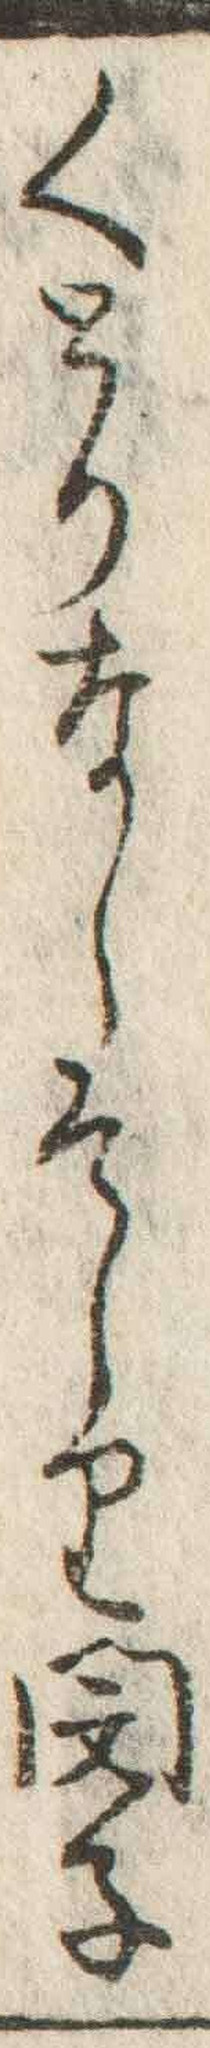くとりなしそしり閔子
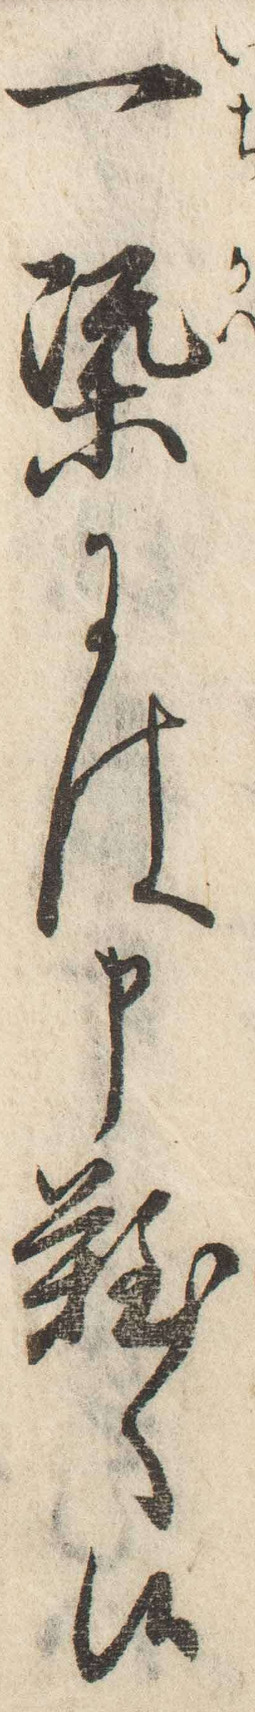一概には申難く候
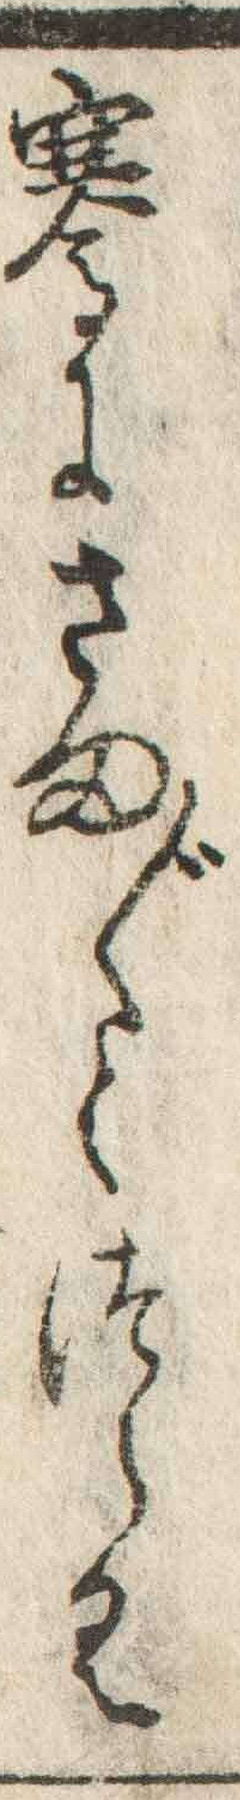騫にさま〴〵とつらく
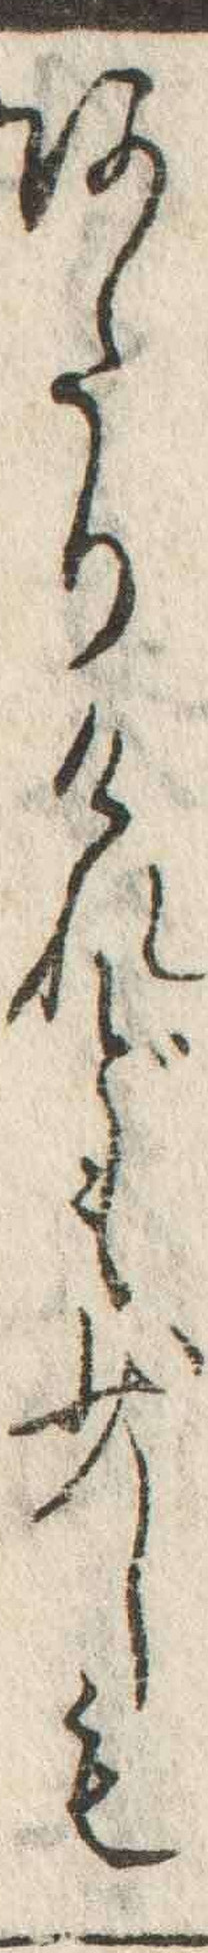あたりけれども少しも
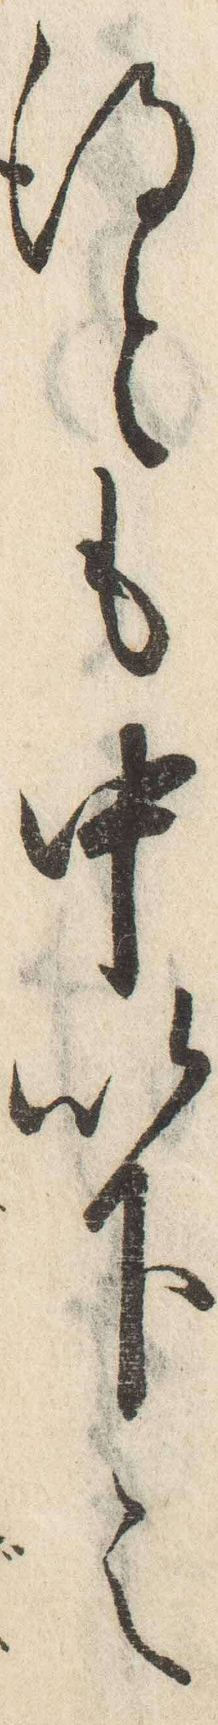得とも中以下之
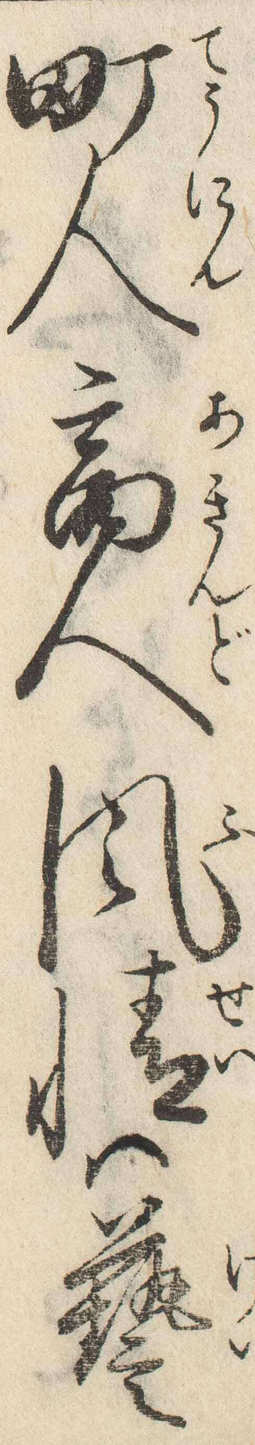町人商人風情は芸
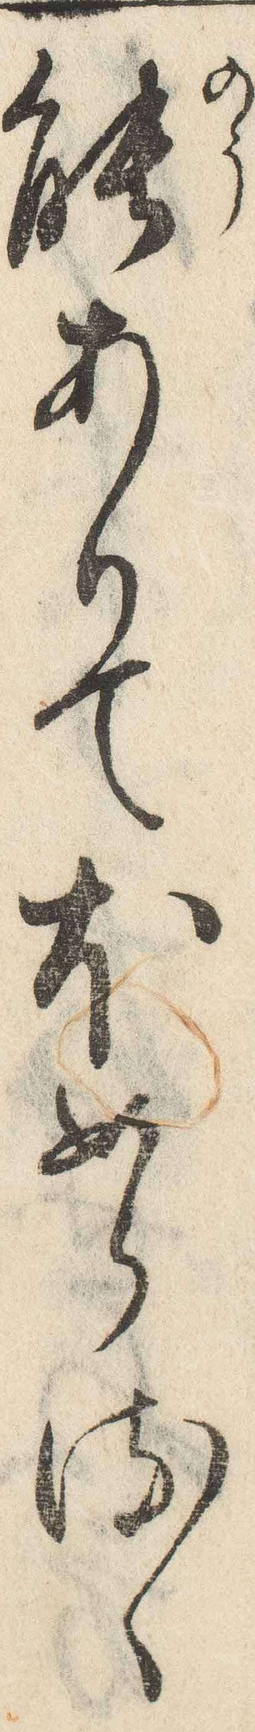能ありてほめらるゝ
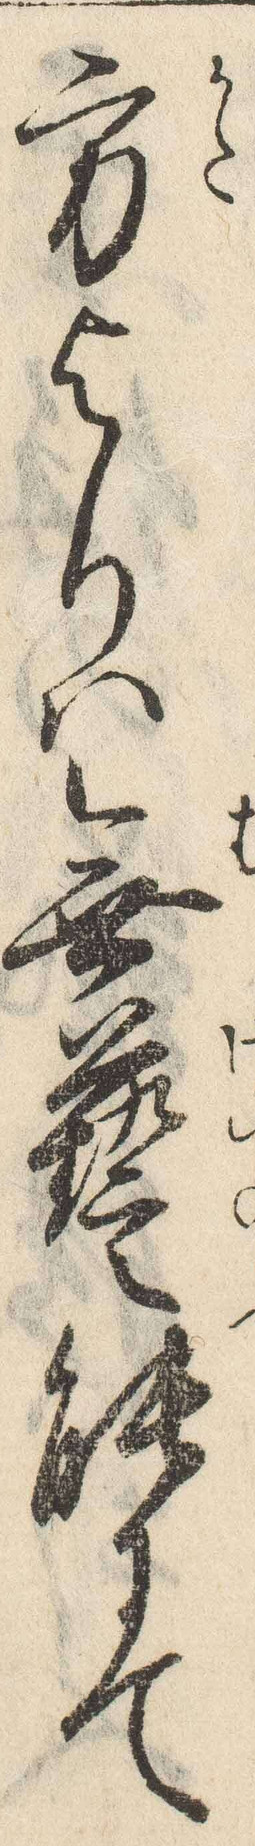方よりは無芸能にて
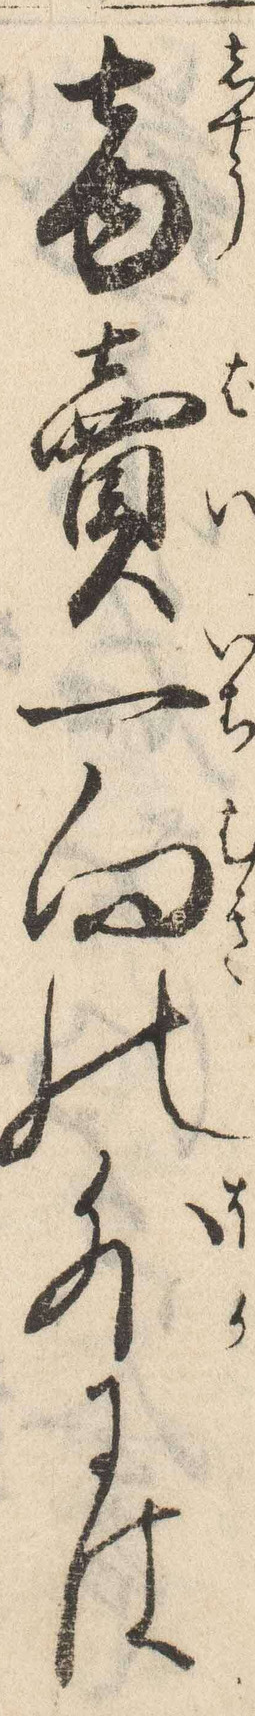商売一向の外には
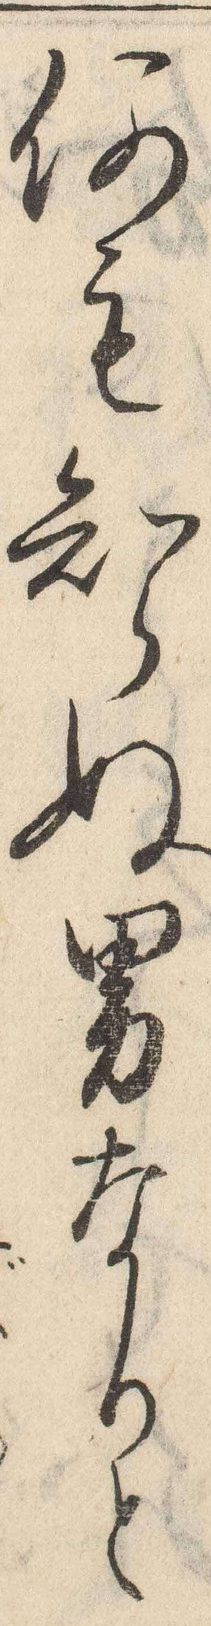何も知らぬ男なりと
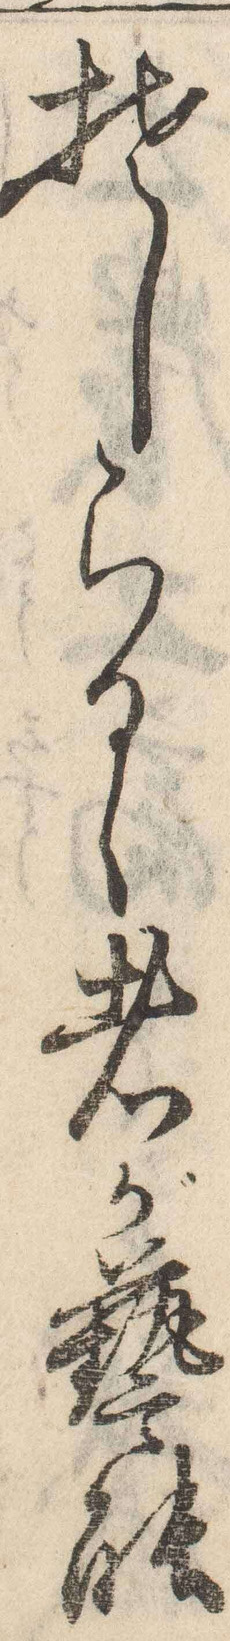そしらるゝ者が芸能
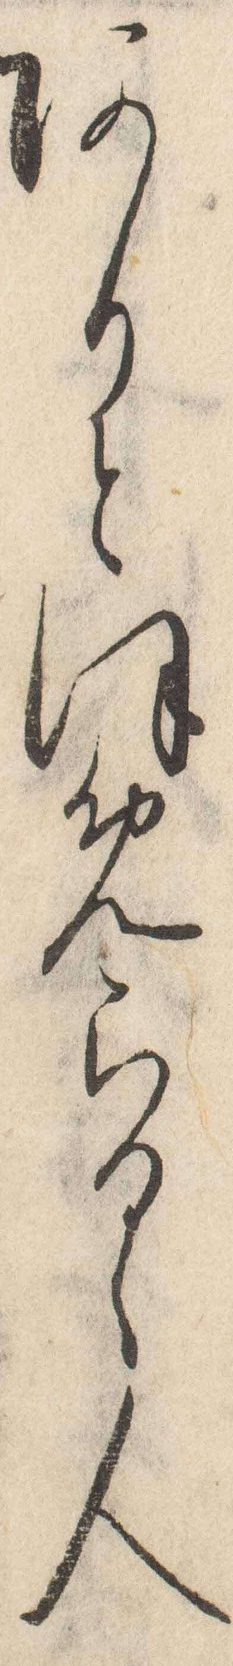ありとほめらるゝ人
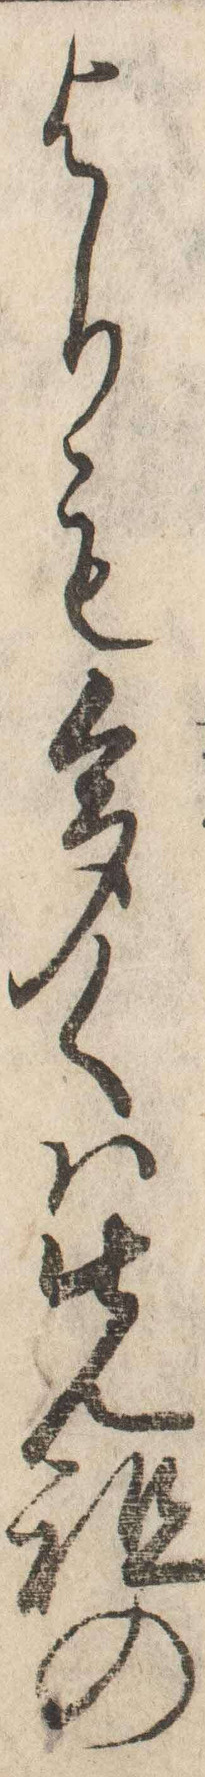よりも多くは先祖の
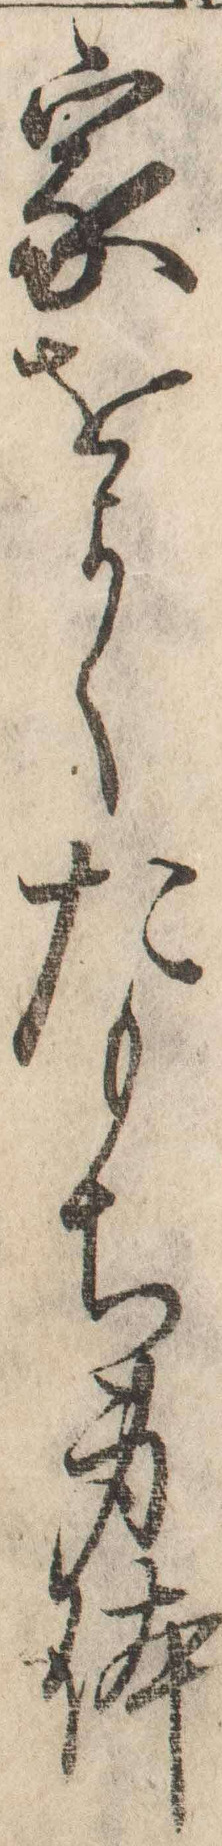家をよくたもち身体

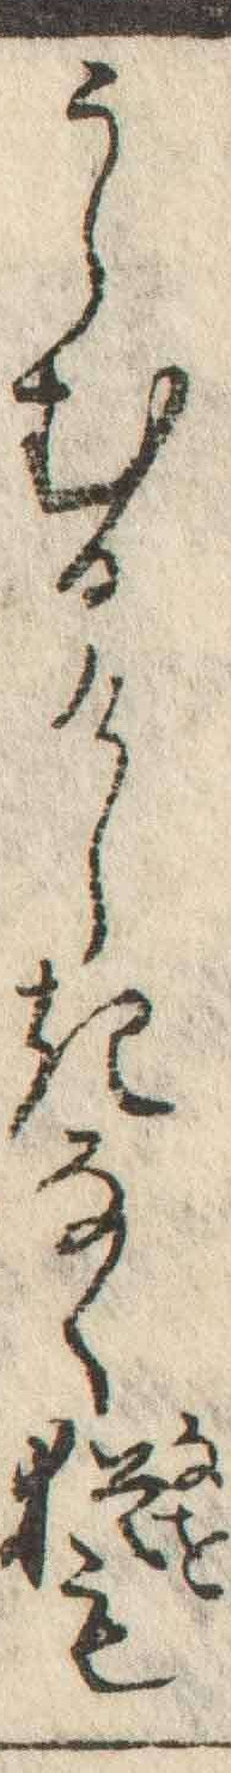うらむるけしきなく猶も
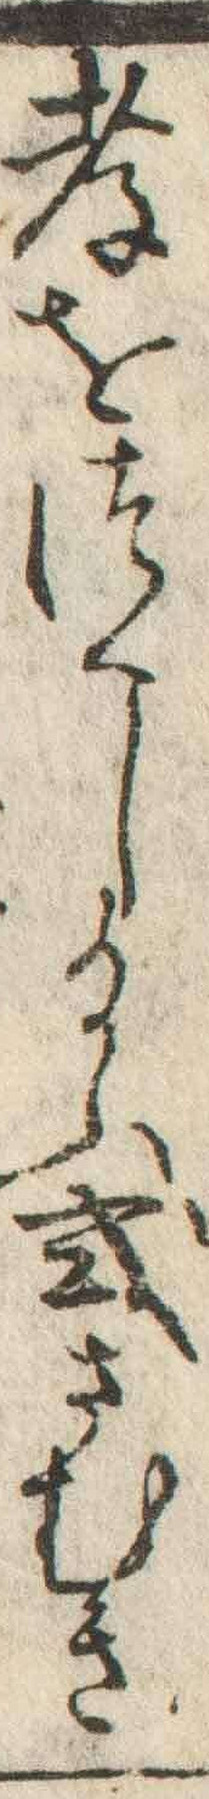孝をつくし給ふ或さむき
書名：撫育草
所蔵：東京学芸大学附属図書館 国文学研究資料館
